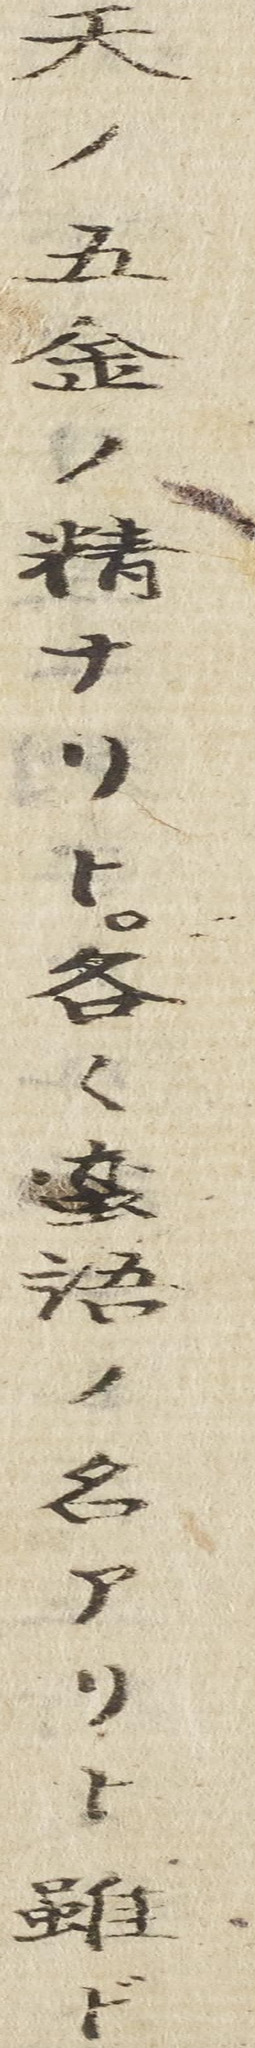天ノ五金ノ精ナリト。各々蛮語ノ名アリト雖ド
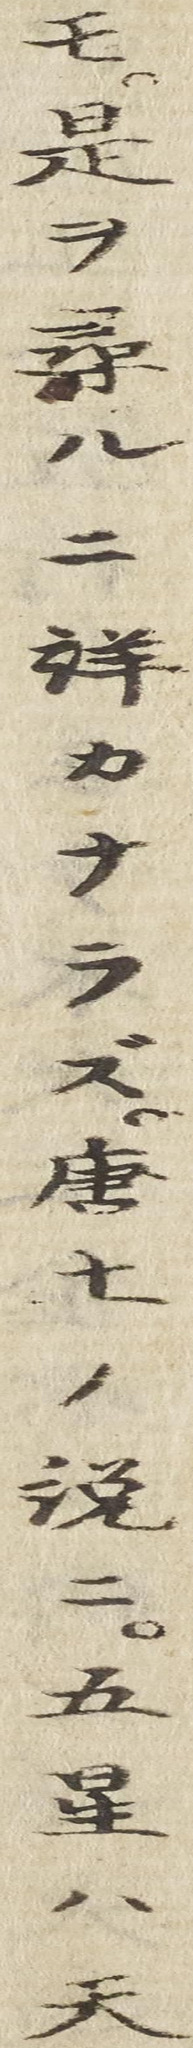モ。是ヲ尋ルニ詳カナラズ。唐土ノ説ニ。五星ハ天
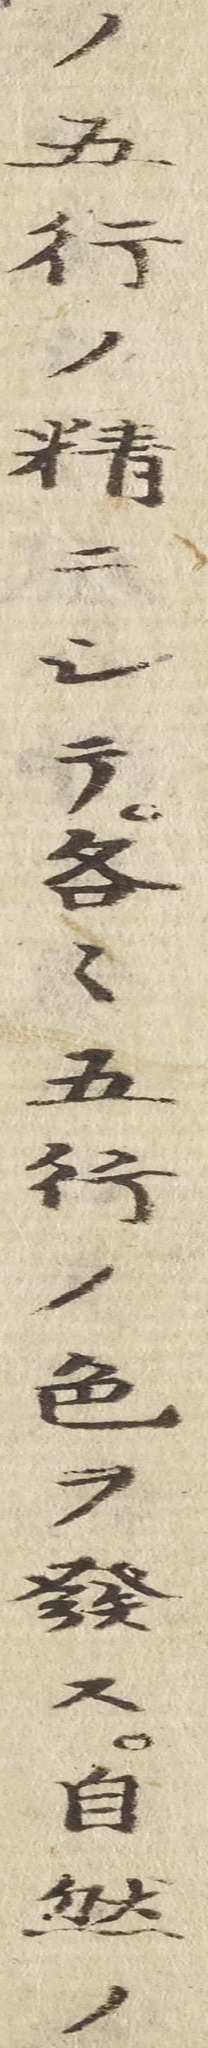ノ五行ノ精ニシテ。各々五行ノ色ヲ発ス。自然ノ
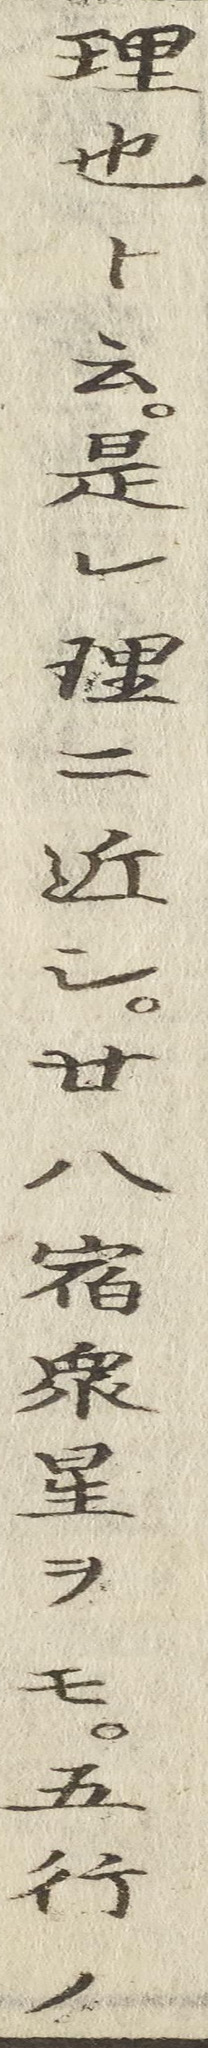理也ト云。是レ理ニ近シ。廿八宿衆星ヲモ。五行ノ
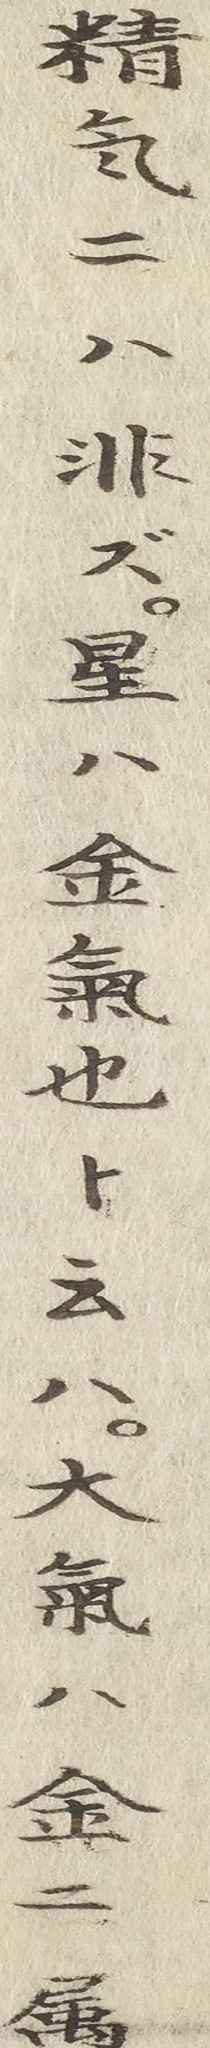精気ニハ非ズ。星ハ金気也ト云ハ。大気ハ金ニ属
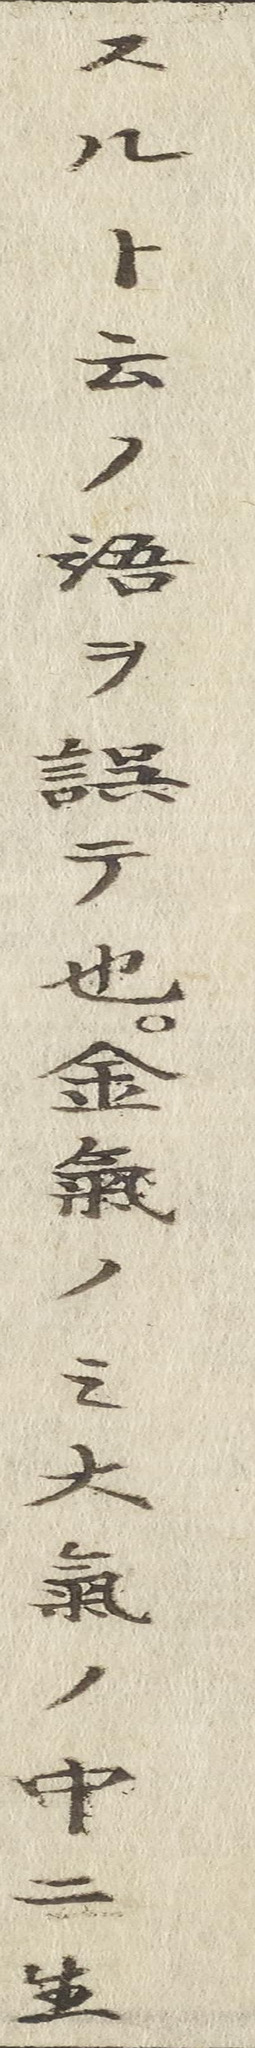スルト云ノ語ヲ誤テ也。金気ノミ大気ノ中ニ生
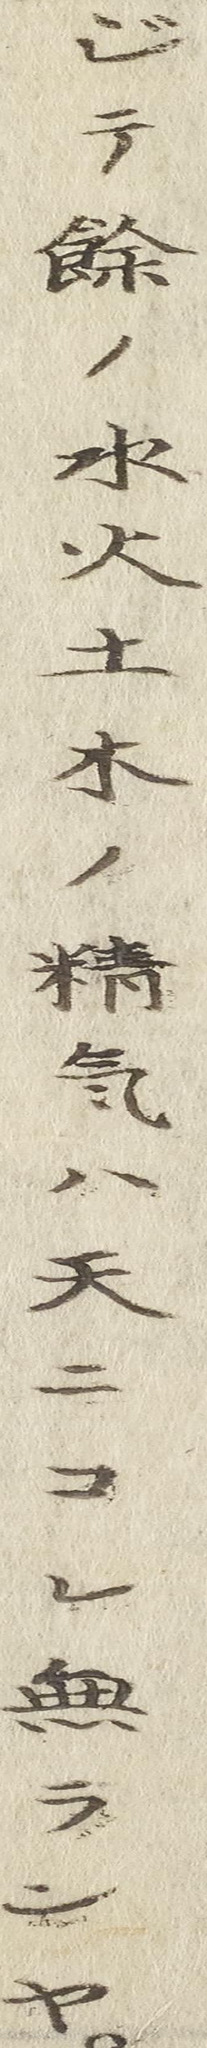ジテ余ノ水火土木ノ精気ハ天ニコレ無ランヤ。
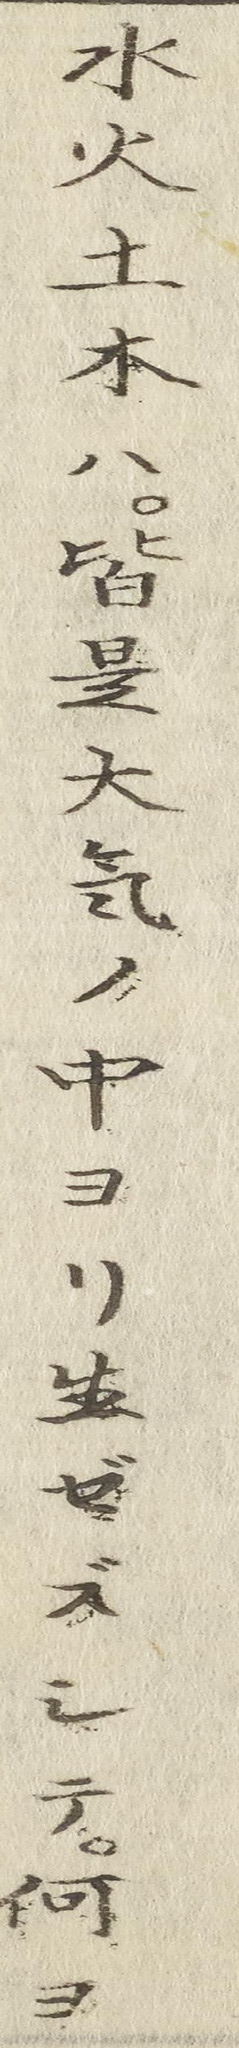水火土木ハ。皆是大気ノ中ヨリ生ゼズシテ。何ヨ
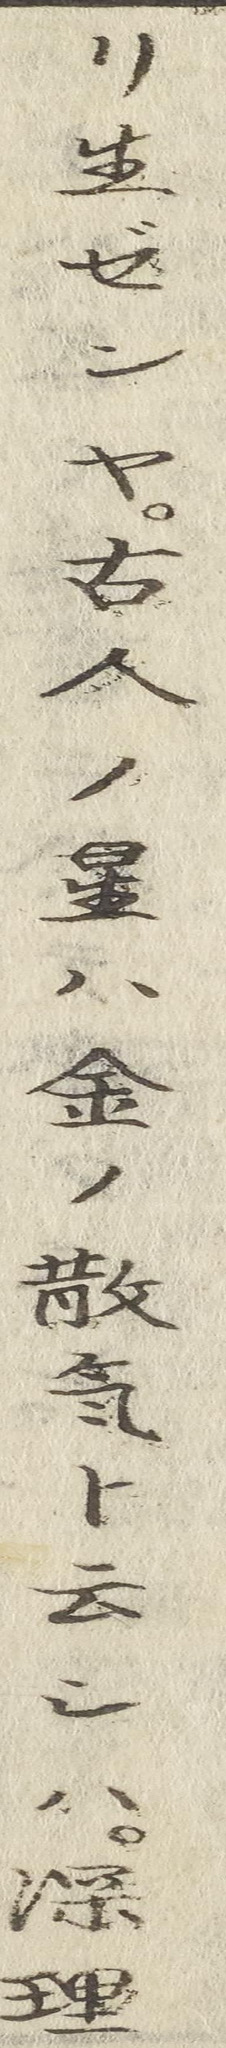リ生ゼンヤ。古人ノ星ハ金ノ散気ト云ンハ。深理
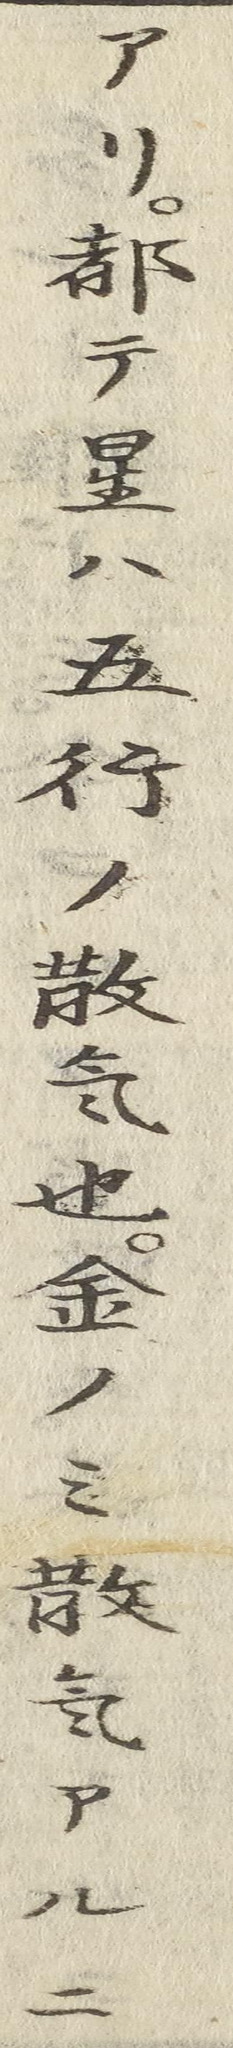アリ。都テ星ハ五行ノ散気也。金ノミ散気アルニ
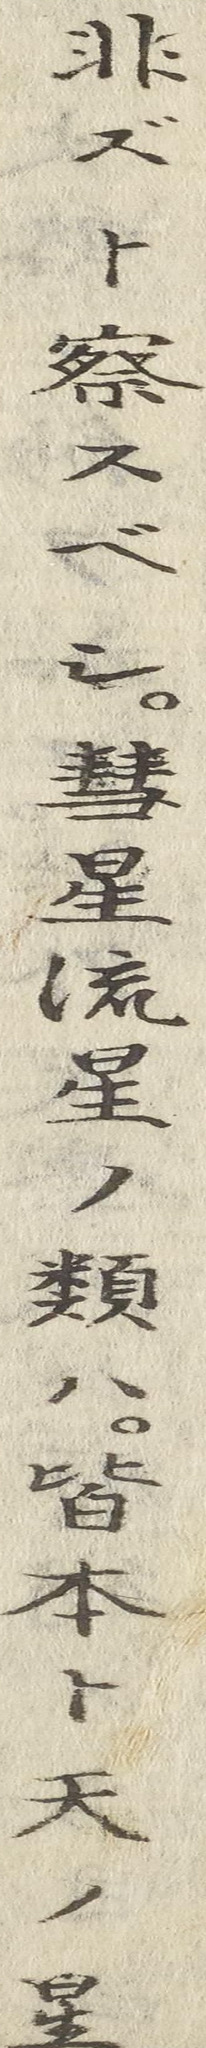非ズト察スベシ。彗星流星ノ類ハ。皆本ト天ノ星
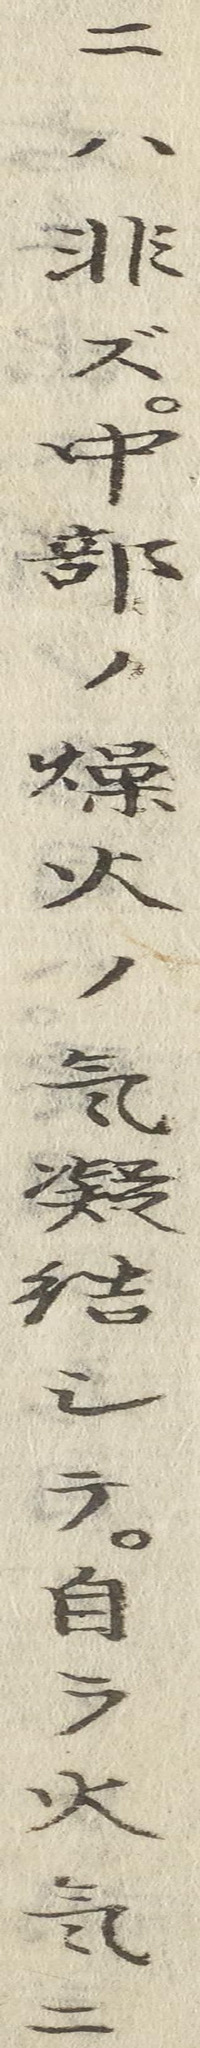ニハ非ズ。中部ノ燥火ノ気凝結シテ。自ラ火気ニ
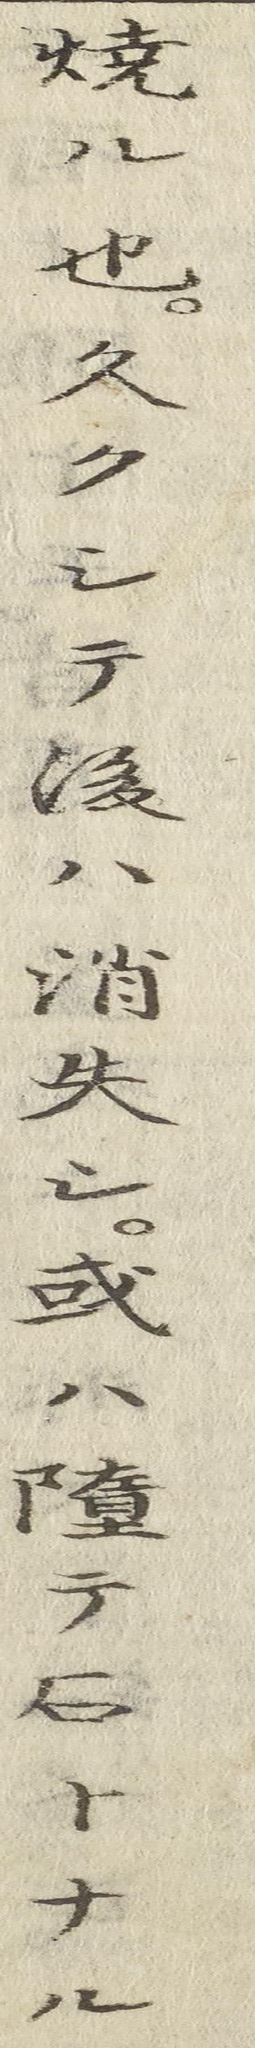焼ル也。久クシテ後ハ消失シ。或ハ墮テ石トナル

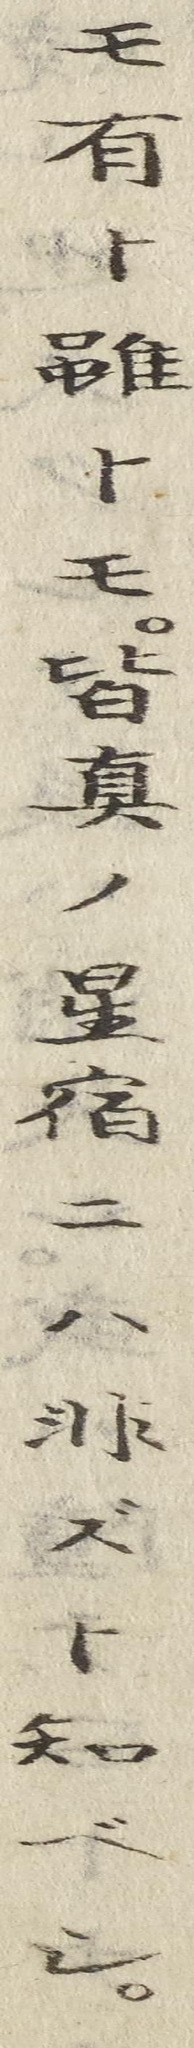モ有ト雖モ。皆真ノ星宿ニハ非ズト知ベシ。
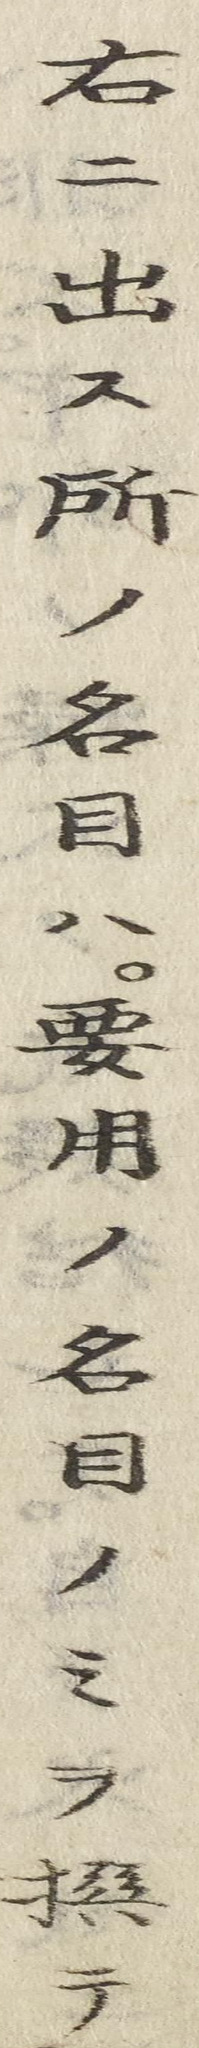右ニ出ス所ノ名目ハ。要目ノ名目ノミヲ撰テ
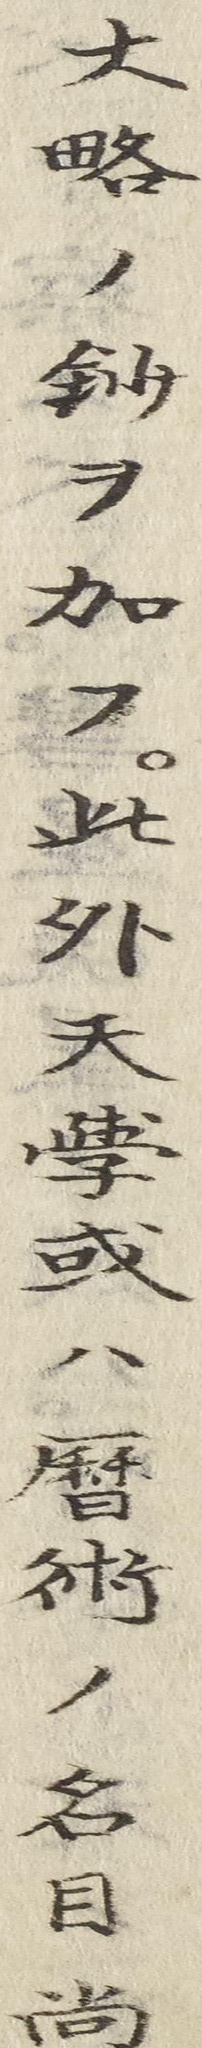大略ノ鈔ヲ加フ。此外天学或ハ暦術ノ名目尚
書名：大略天学名目鈔　天經或問附録
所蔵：東京大学地震研究所図書室 Earthquake Research Institute Library, The University of Tokyo, JAPAN
